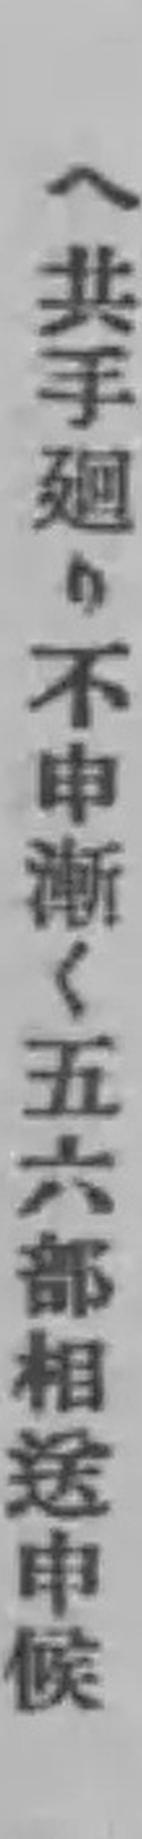へ共手廻り不申漸く五六部相送申候
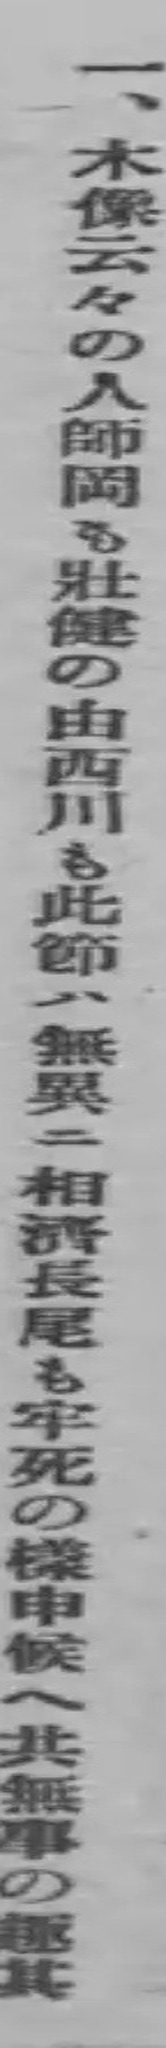一、木像云々の人師岡も壮健の由西川も此節は無異ニ相済長尾も牢死の様申候へ共無事の趣其
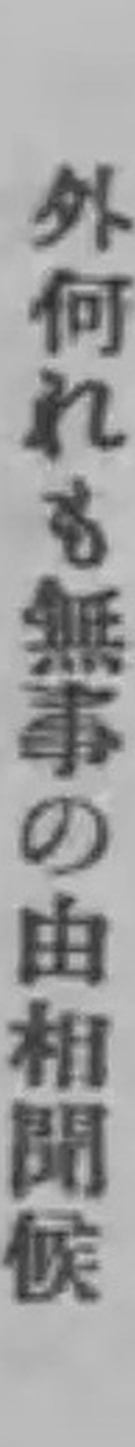外何れも無事の由相聞候
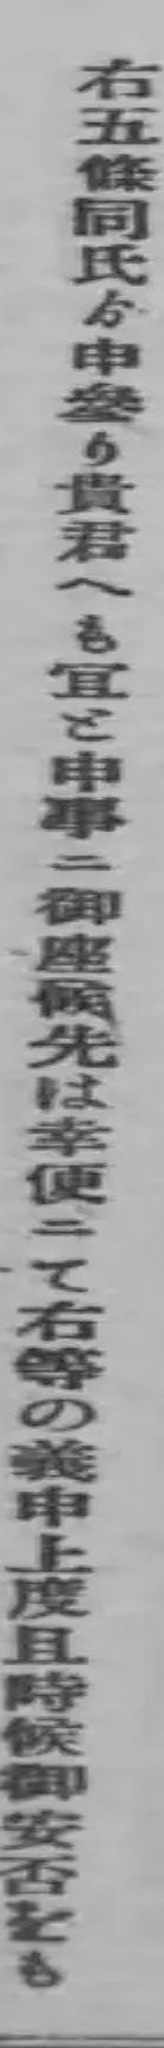右五條同氏ゟ申参り貴君へも宜と申事ニ御座候先は幸便ニて右等の義申上度且時候御安否をも
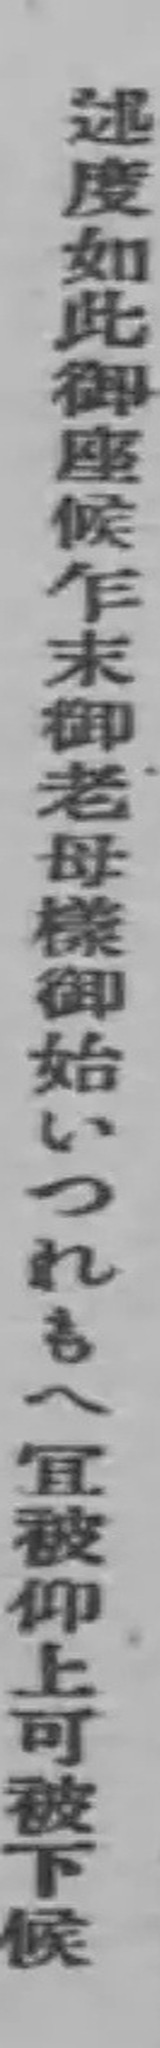述度如此御座候乍未御老母様御始いつれもへ宜被仰上可被下候
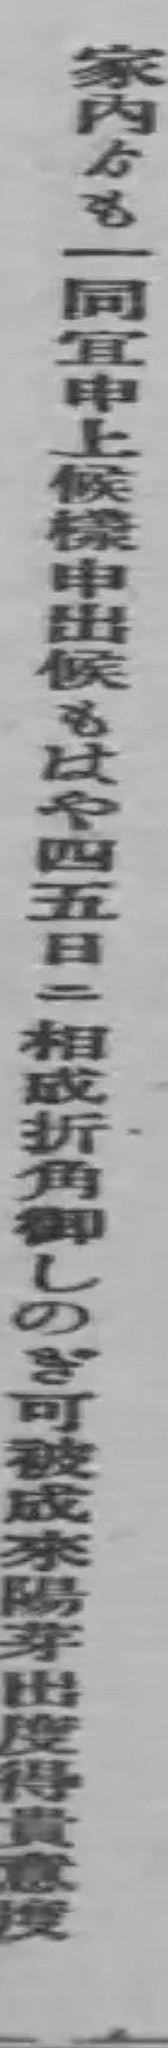家内ゟも一同宜申上候様申出候もはや四五日ニ相成折角御しのぎ可被成来陽芽出度得貴意度
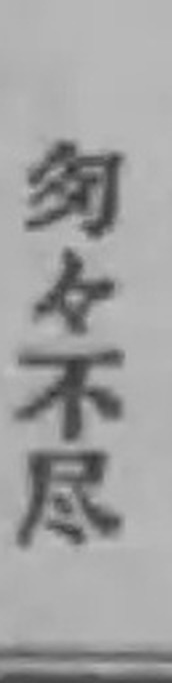匇々不尽
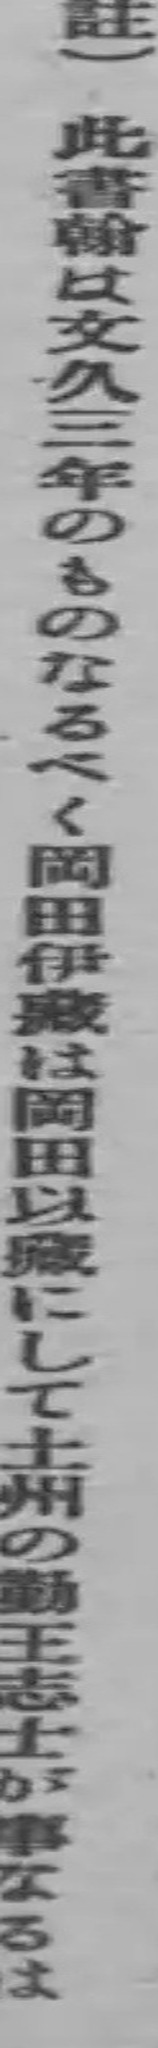(註)此書翰は文久三年のものなるべく岡田伊蔵は岡田以蔵にして土州の勤王志士が事なるは
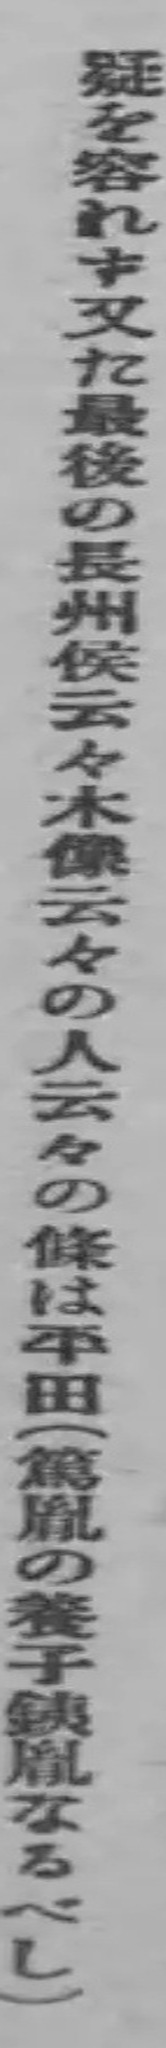疑を容れず又た最後の長州侯云々木像云々の人云々の條は平田(篤胤の養子銕胤なるべし)
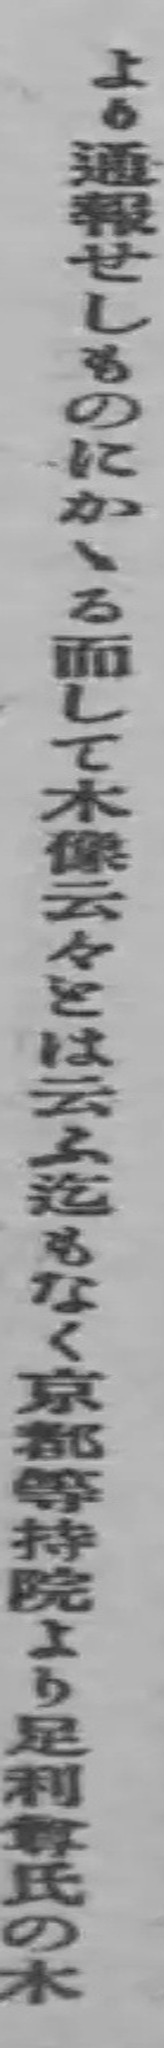より通報せしものにかゝる而して木像云々とは云ふ迄もなく京都等持院より足利尊氏の木
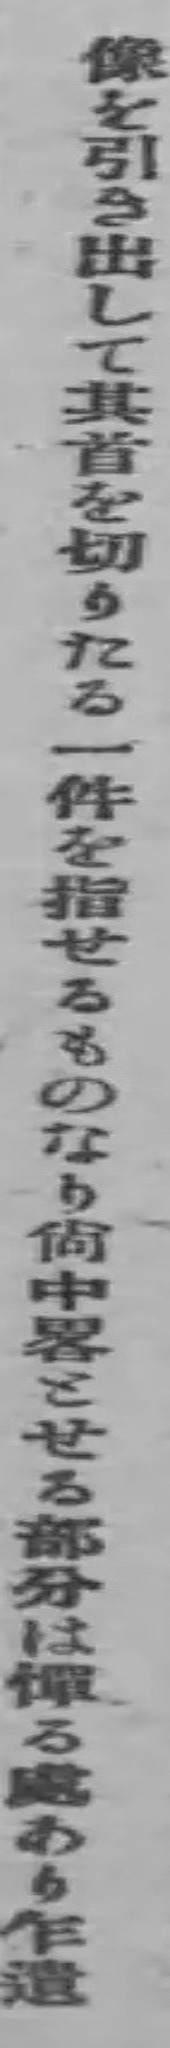像を引き出して其首を切りたる一件を指せるものなり尚中略とせる部分は憚る処あり乍遺
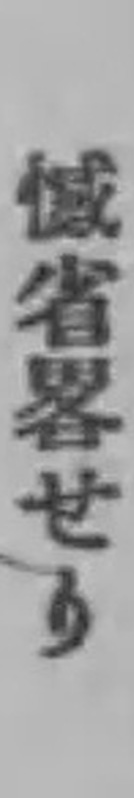憾省略せり
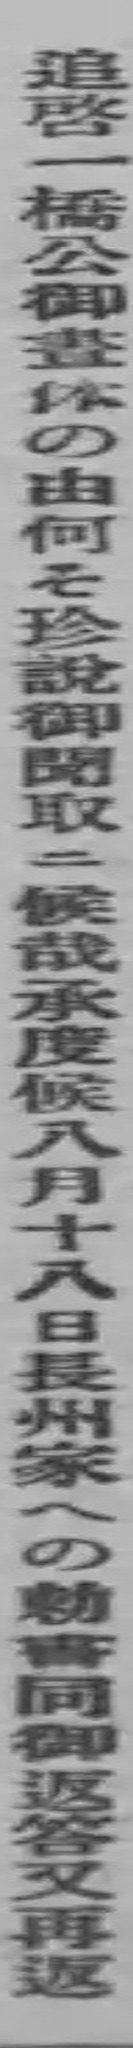追啓一橋公御晝体の由何そ珍説御聞取ニ候哉承度候八月十八日長州家への勅書同御返答又再返
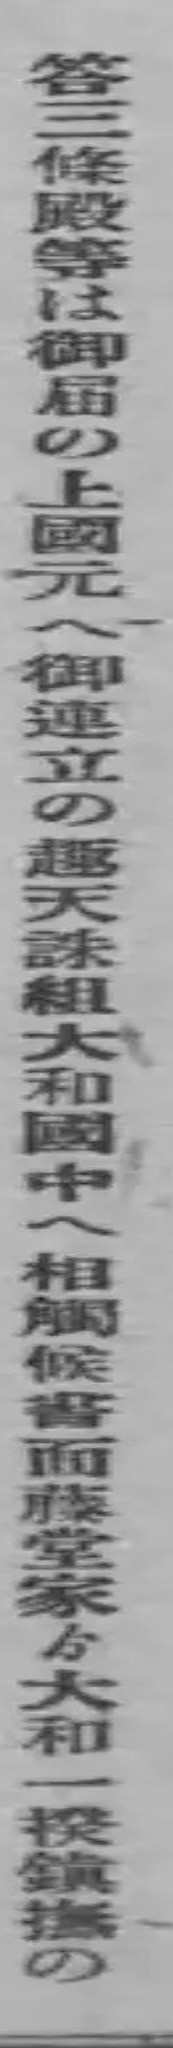答三條殿等は御届の上国元へ御連立の趣天誅組大和国中へ相觸候書面藤堂家ゟ大和一揆鎮撫の
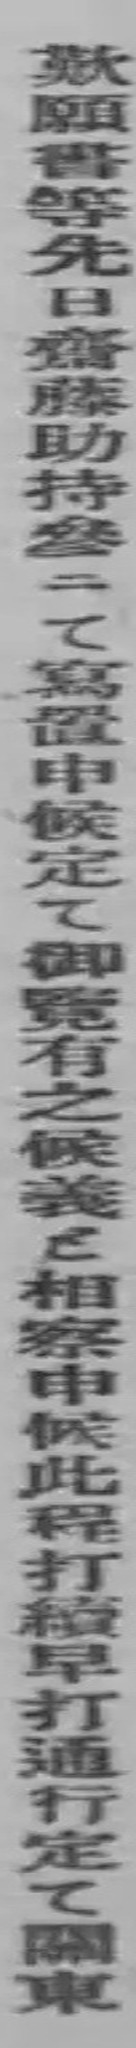歎願書等先日齋藤助持参ニて写置申候定て御覧有之候義と相察申候此程打続早打通行定て関東
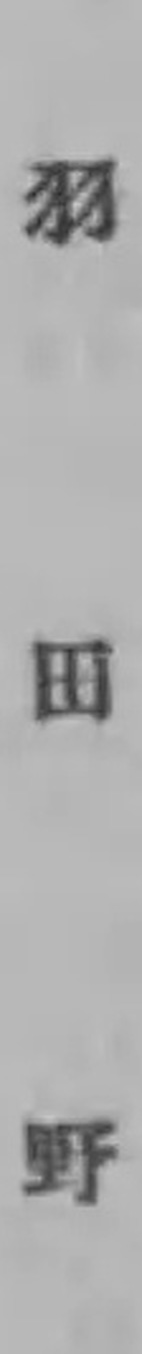羽田野
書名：豊橋市史談
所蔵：国立国会図書館 National Diet Library, JAPAN
